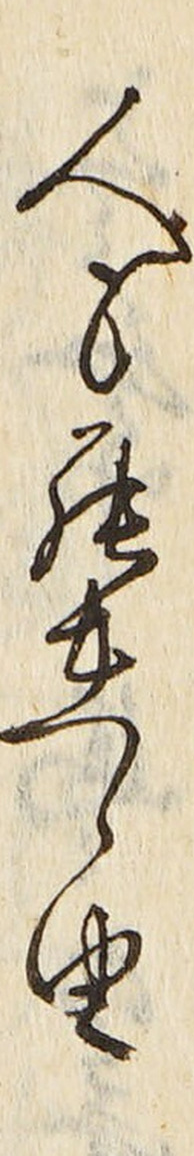人も罷在候由
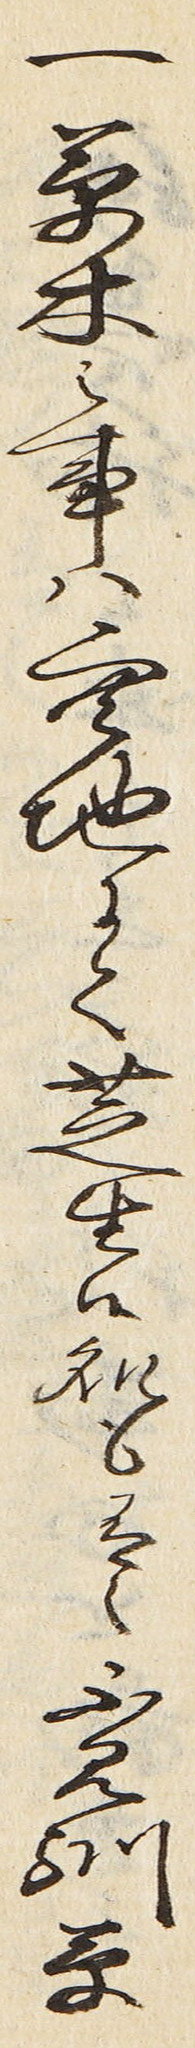一草木之事は空地にて芝生候処も有之不見馴草
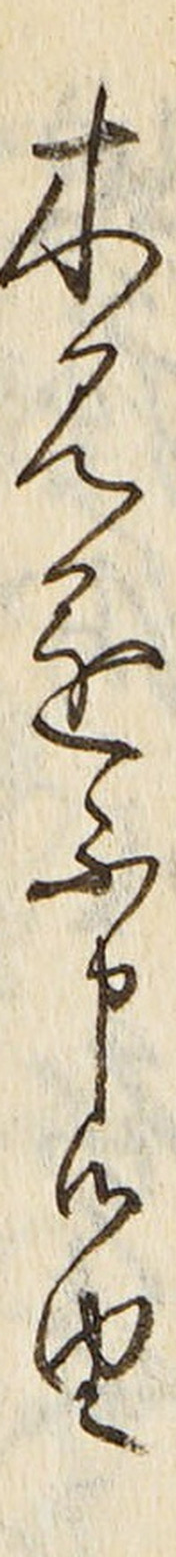木見懸不申候由
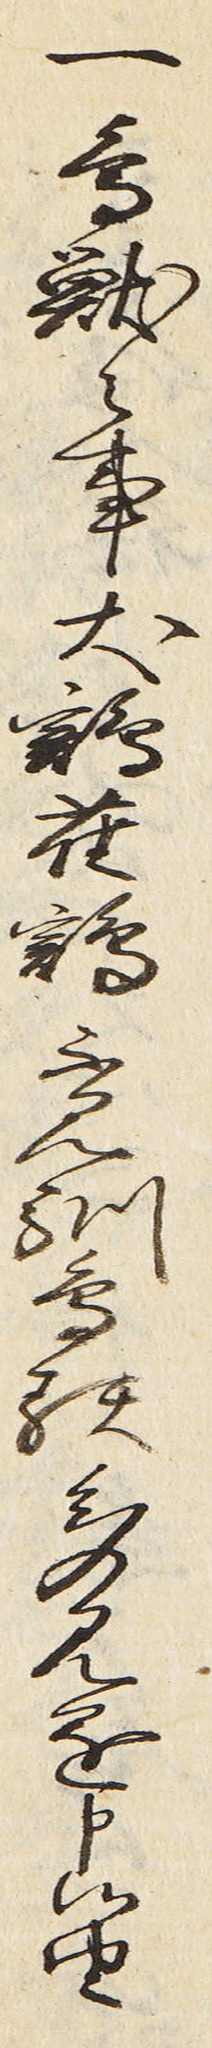一鳥獣之事犬鶏萑鶏不見馴鳥類多見懸申候由
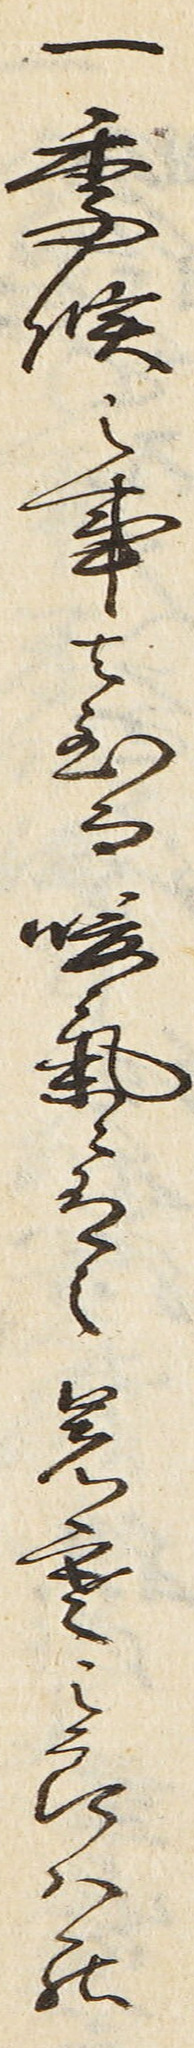一季候之事は至而暖気に有之暑寒之節は罷
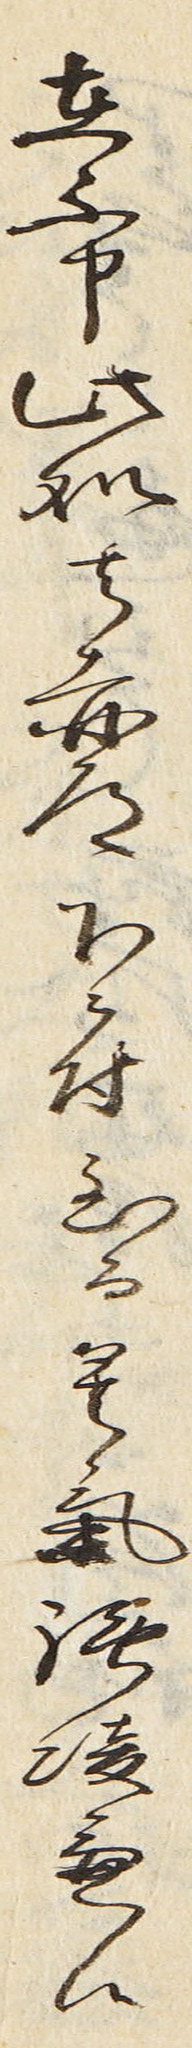在不申此処は赤道下に付至而暑気強凌雨候
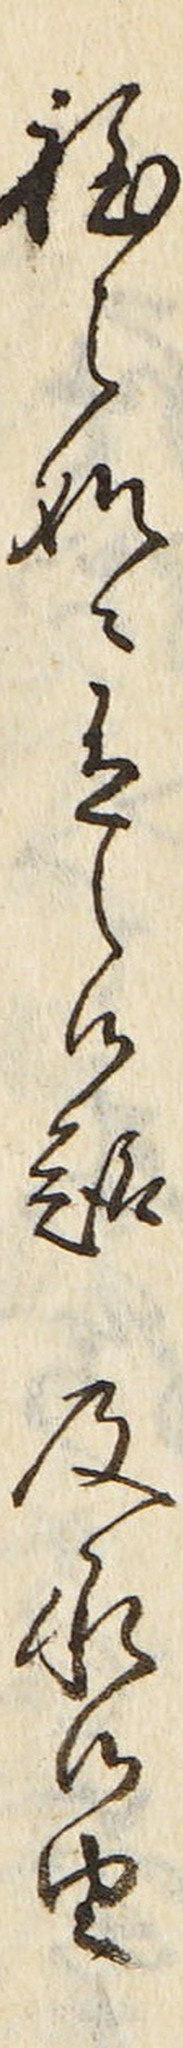之処に有之候趣及承候由
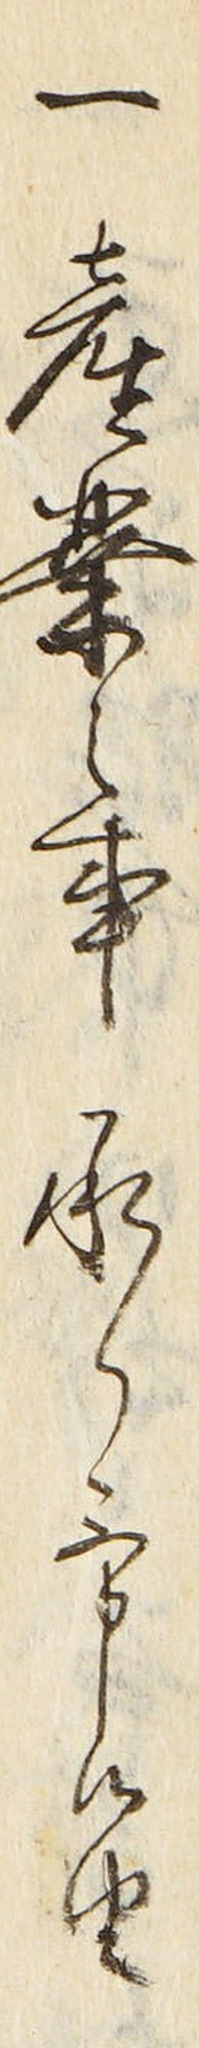一産業之事承り不申候由
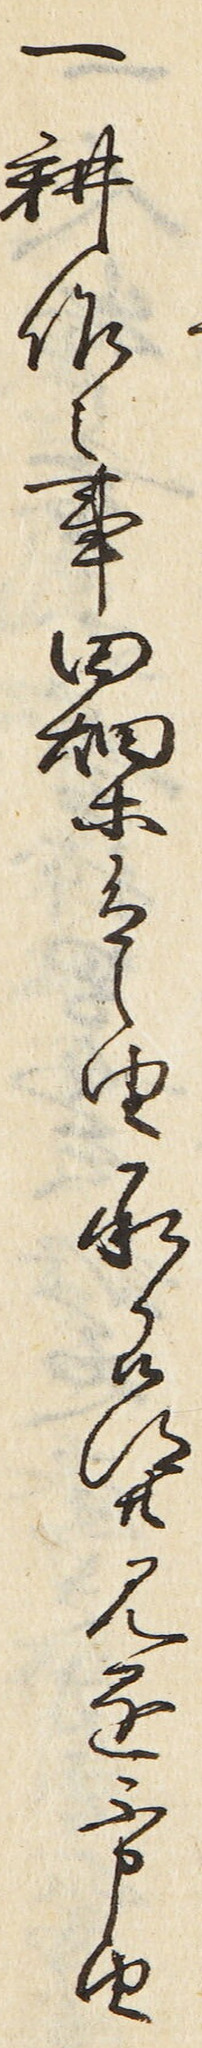一耕作之事田畑等有之由承り候共見懸不申由
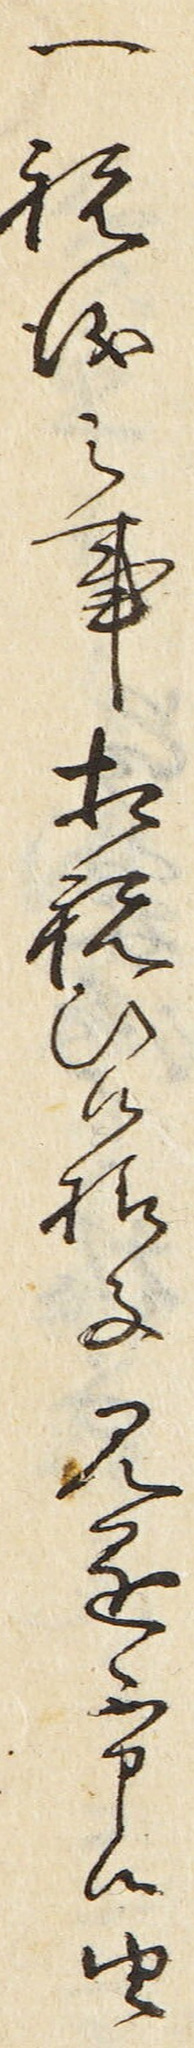一祝儀之事相祝ひ候様子見懸不申候由

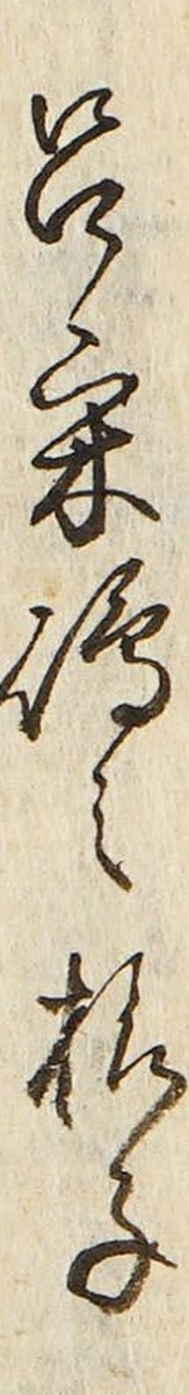呂宋嶋之様子
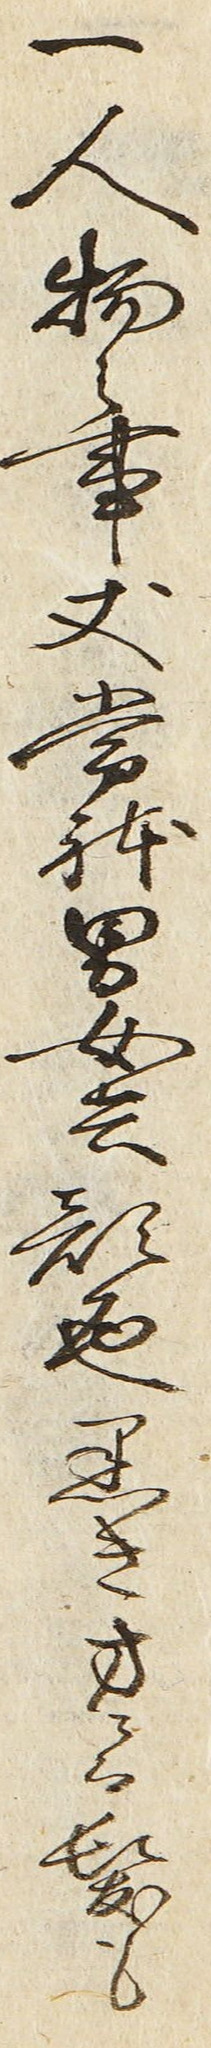一人物之事丈常躰男女共顔色黒き方に而髪も
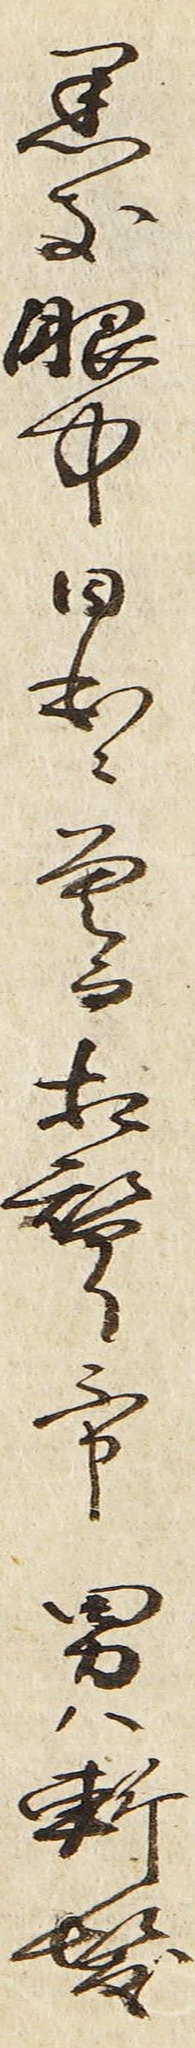黒き眼中日本に差而相替り不申男は斬髪
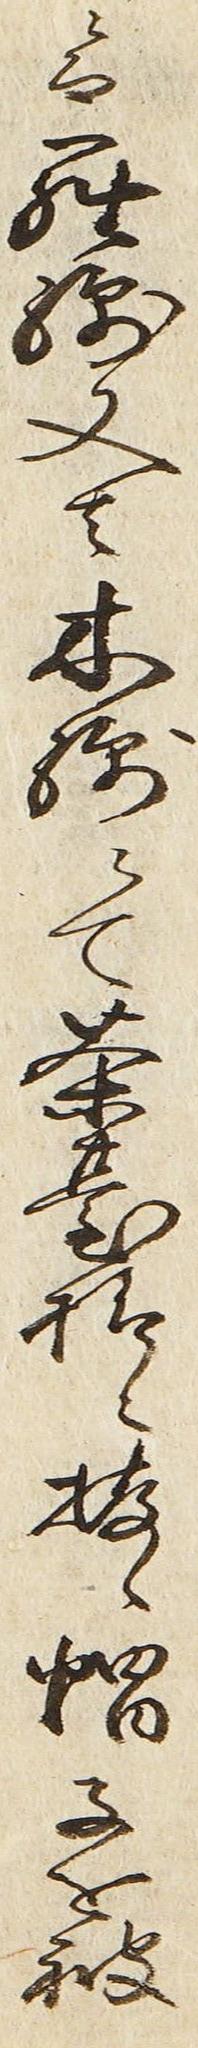に而羅綿又は木綿にて茶台様に拵候帽子を被
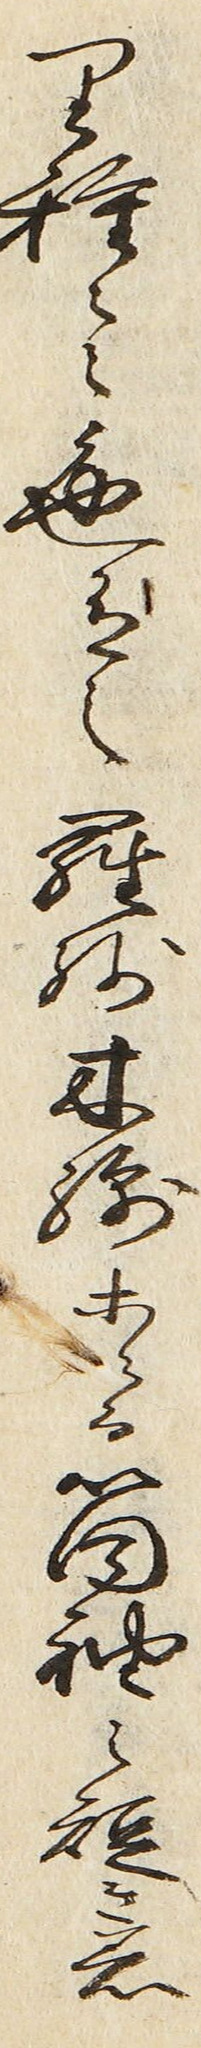り種々之色有之羅紗木綿等に而筒袖之短き着
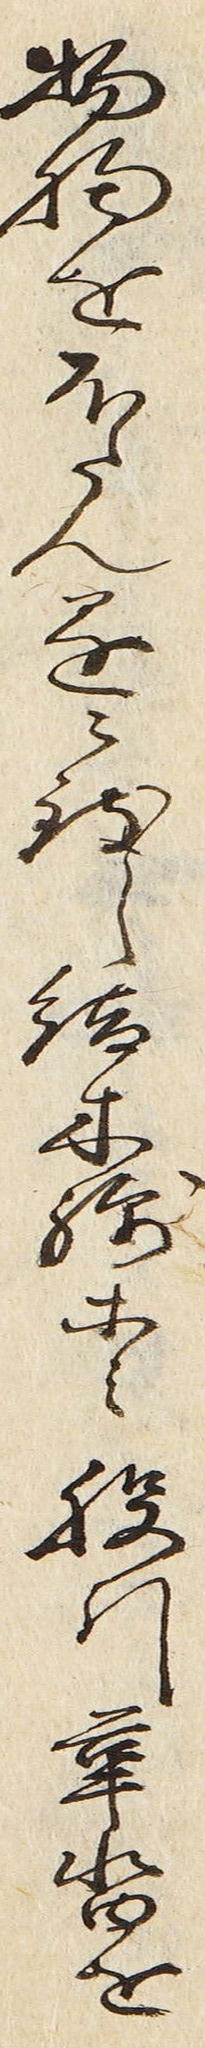物胸をほたん懸に致結実木綿等之股引革靴を
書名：土佐中浜万次郎漂流記
